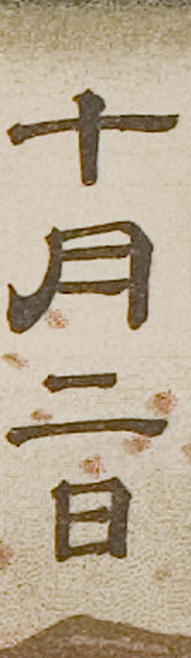十月二日
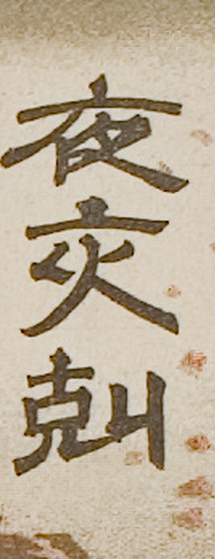夜亥剋
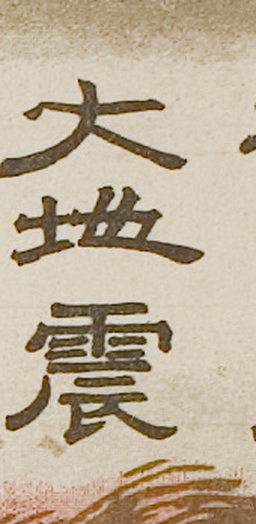大地震
